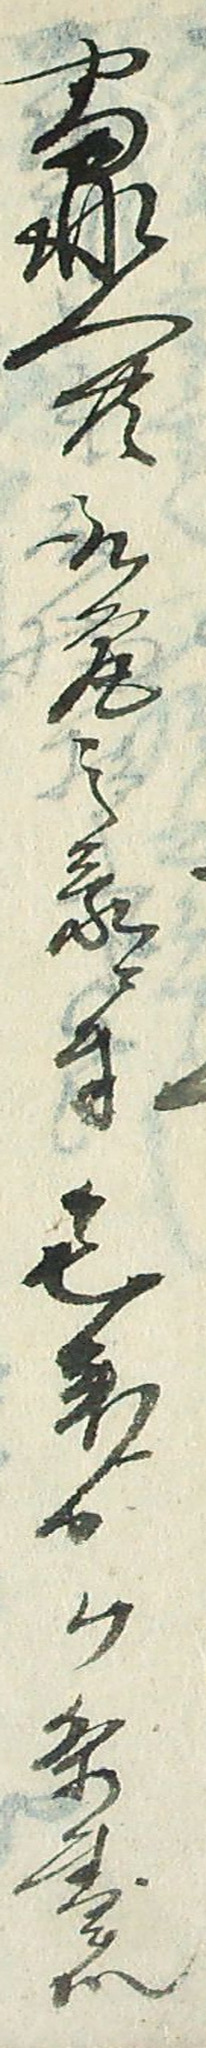番非人共取究之義に付き丑年ゟケ条書を以
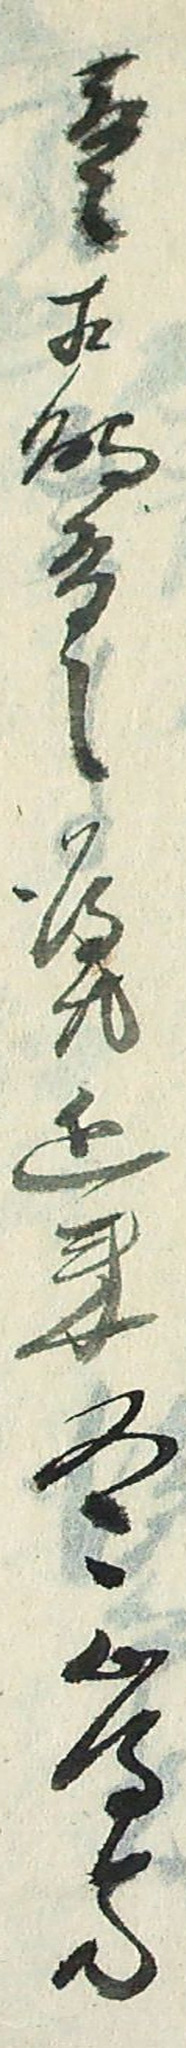度々相触有之候得共近来又々心得方
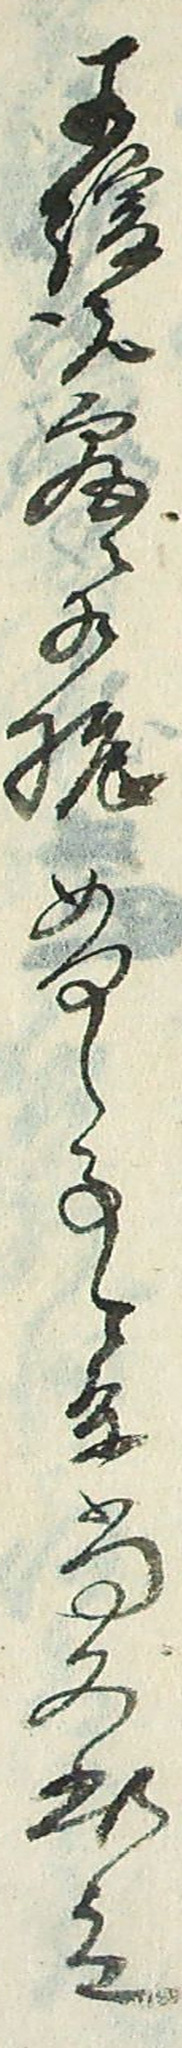相緩取究に相振如何之事候条尚又此度

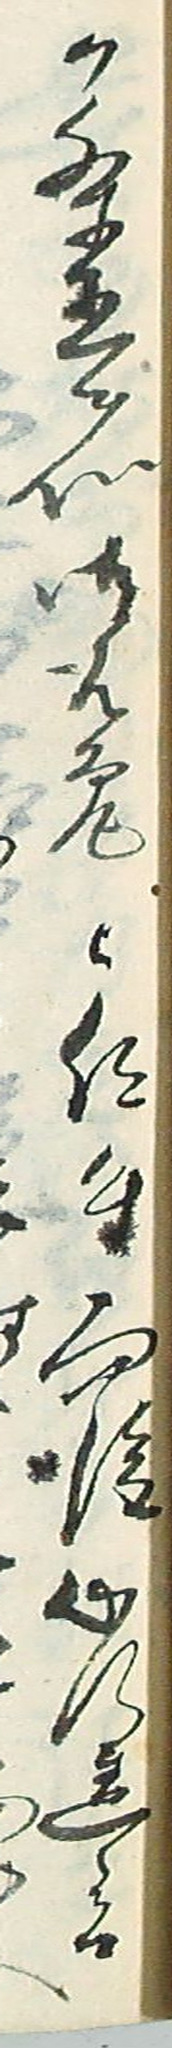ケ条書を以御取究被仰付向後心得違之者
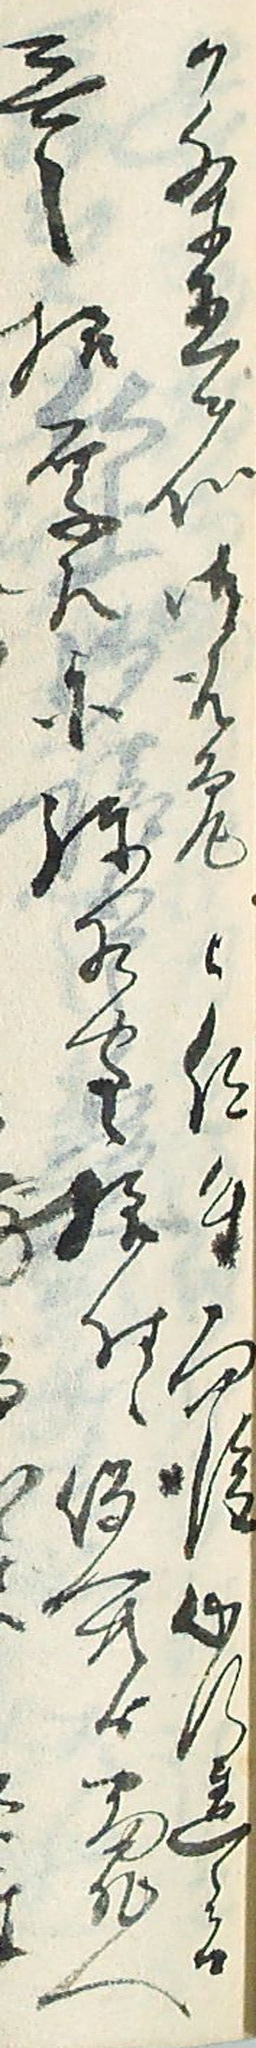無之様厚取図弥相守候様村々役人共ゟ番非人
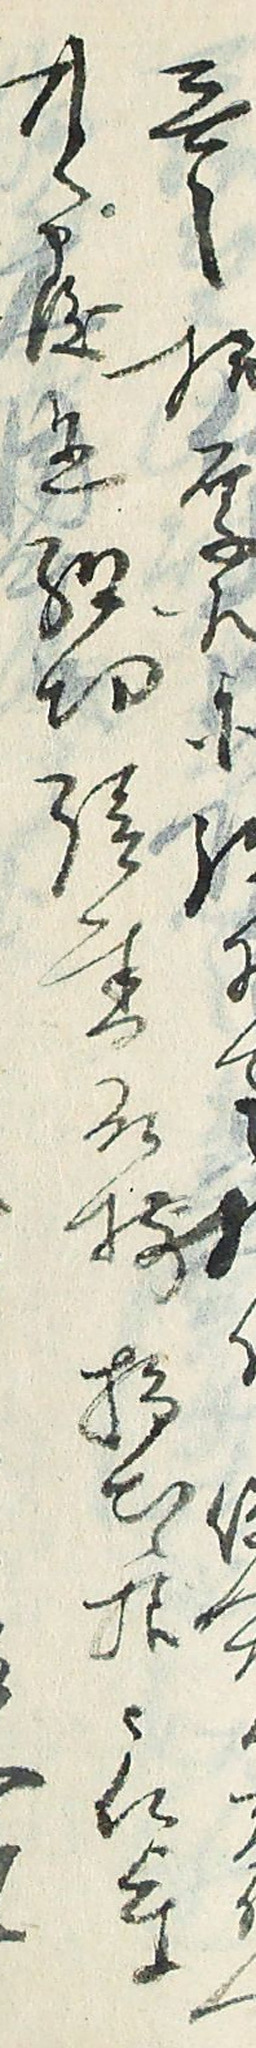共へ申渡置組切請書取揃指出候様被仰付
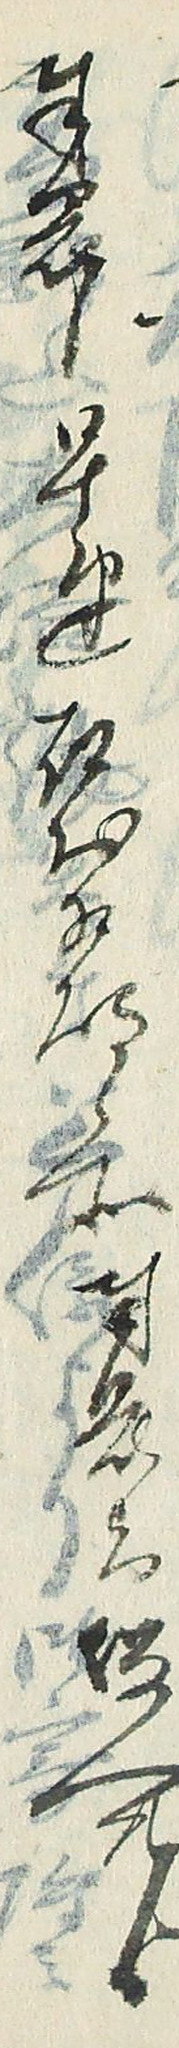奉畏候早速組村相触候所奉畏旨役人共ゟ
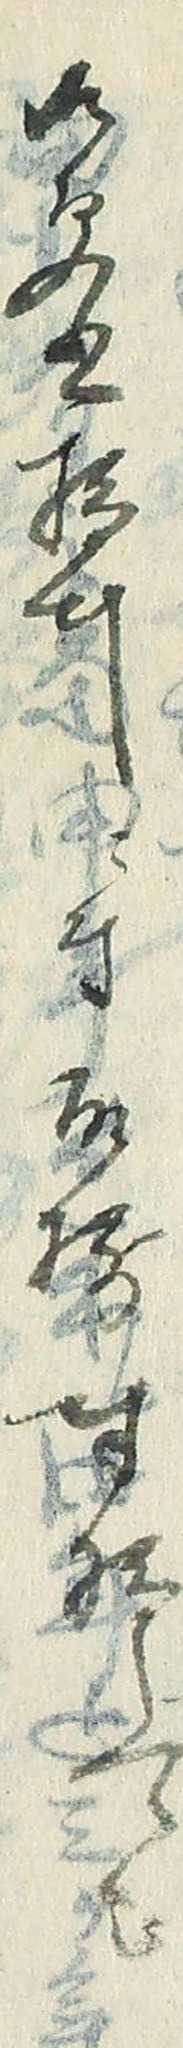御受書指出し候に付取揃奉指上候以上
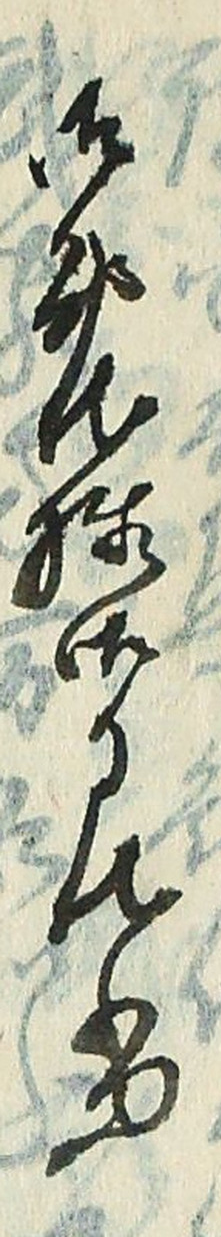御郡代様御手代当
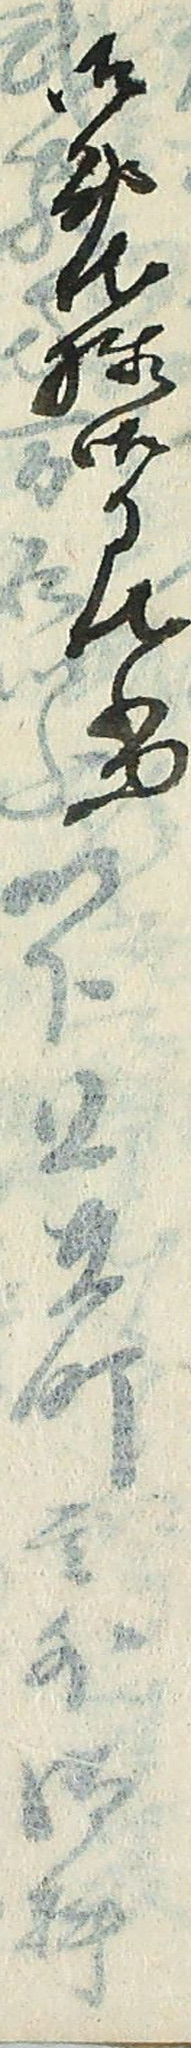御郡代様御手代当
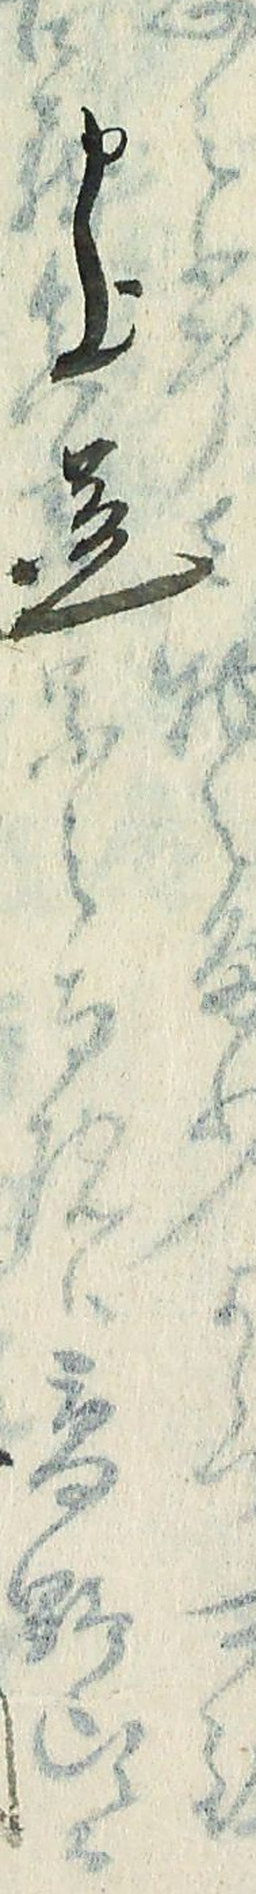申上覚
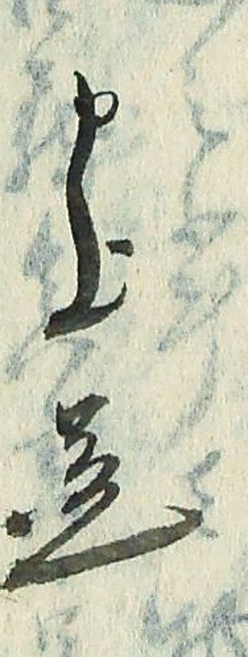申上覚
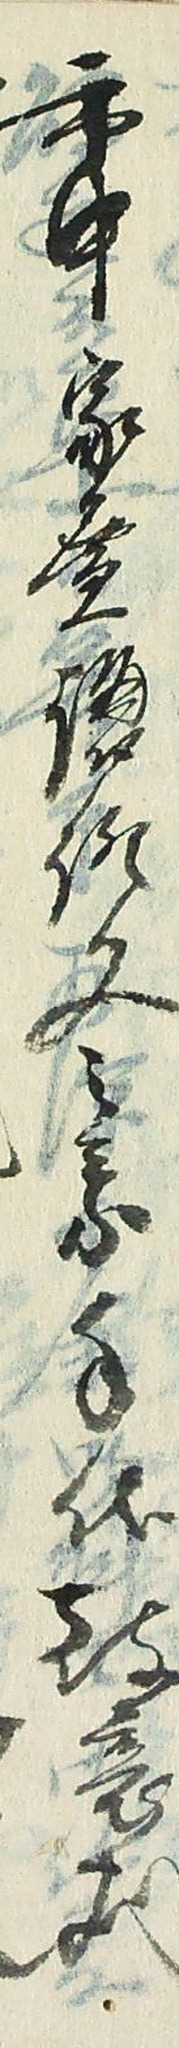市中家屋鋪證文之義手代致裏判
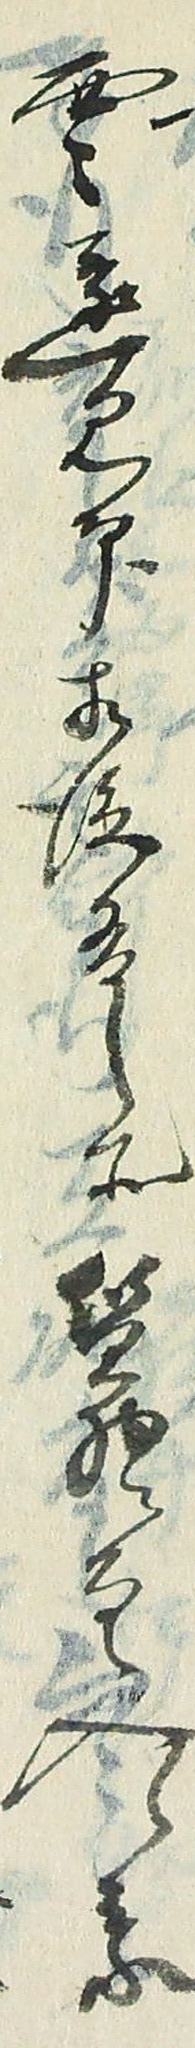面々遂見印相渡有之所質物に差入候義
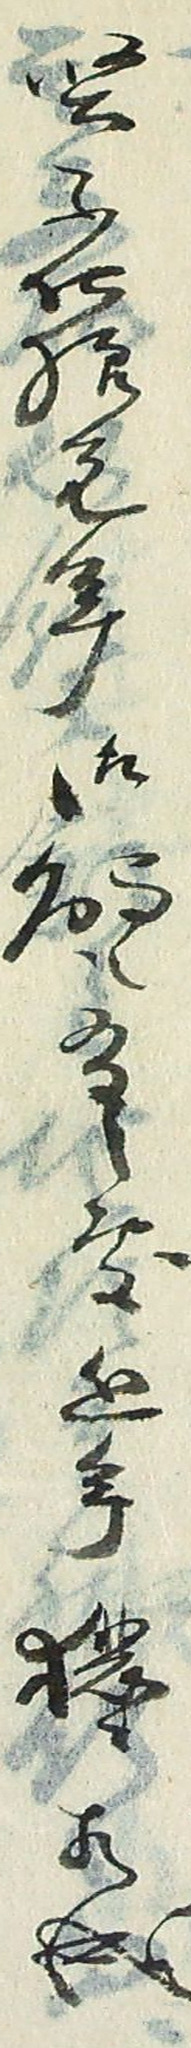堅不仕様先年御触も有之処近年猥に相成
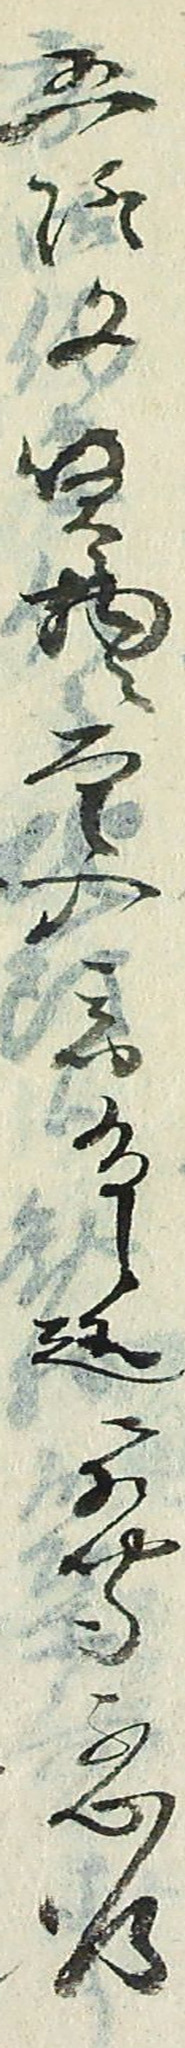右證文質物に差入候者有之趣に相聞不心得
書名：諸御用御□受書控
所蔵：鳴門教育大学 Naruto University of Education
